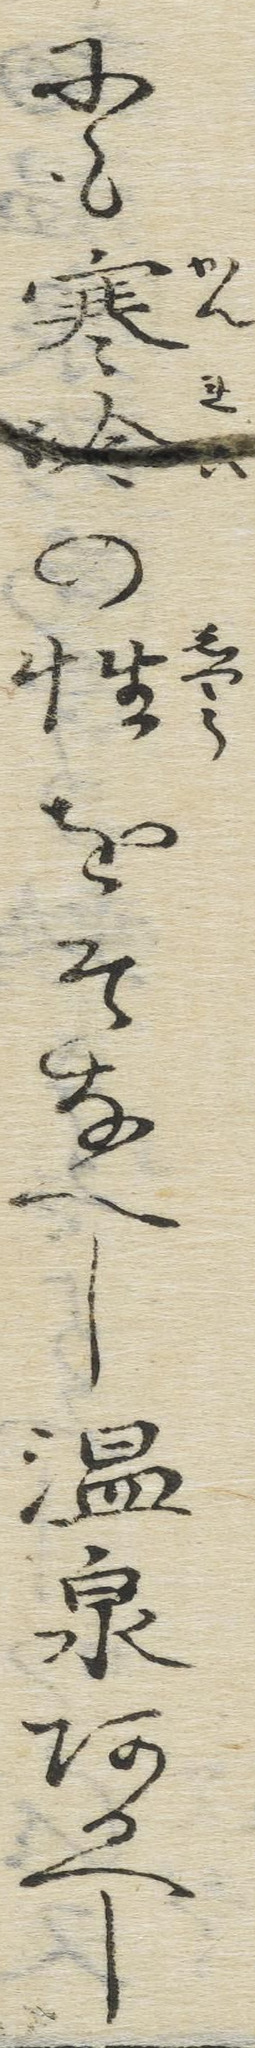にも寒冷の性をそなへし温泉あるへし
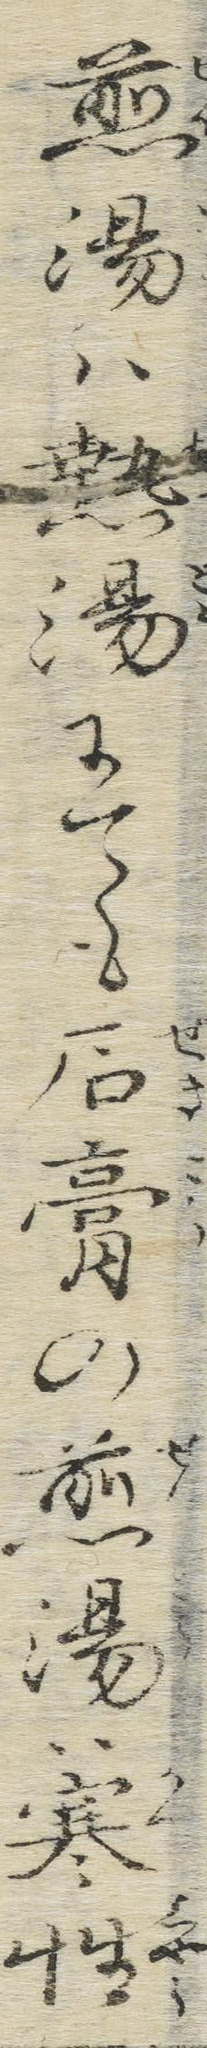煎湯は熱湯にても石膏の煎湯は寒性
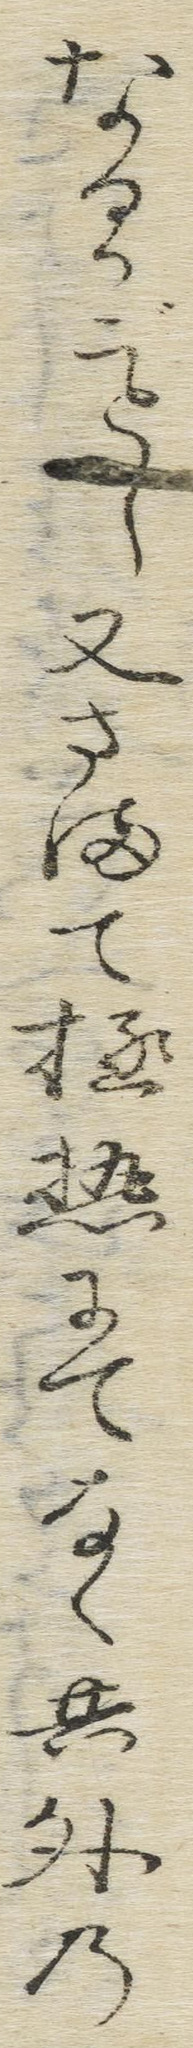なるかことし又さまて極熱にてなく共外の
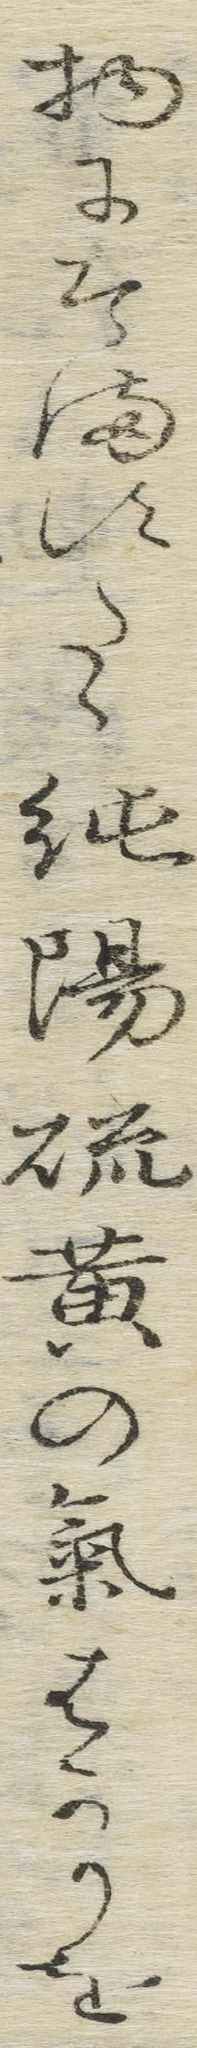物にそますたゝ純陽硫黄の気はかりを
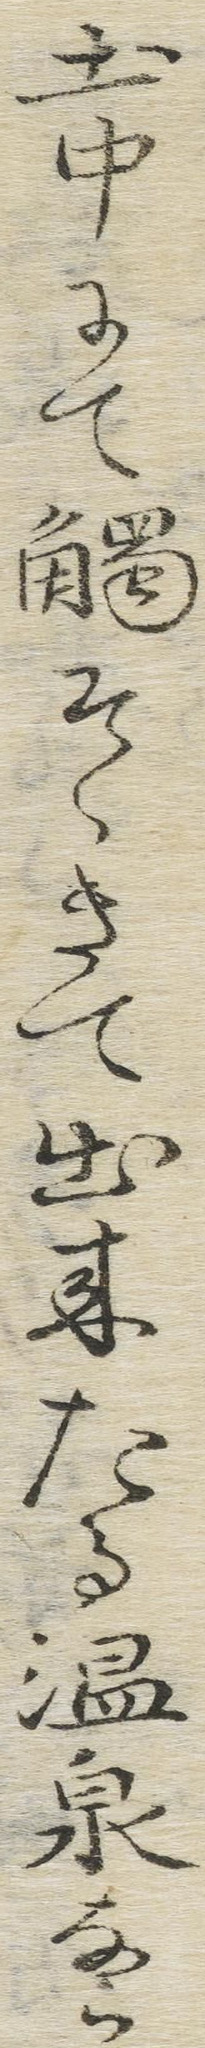土中にて触そゝきて出来たる温泉なら
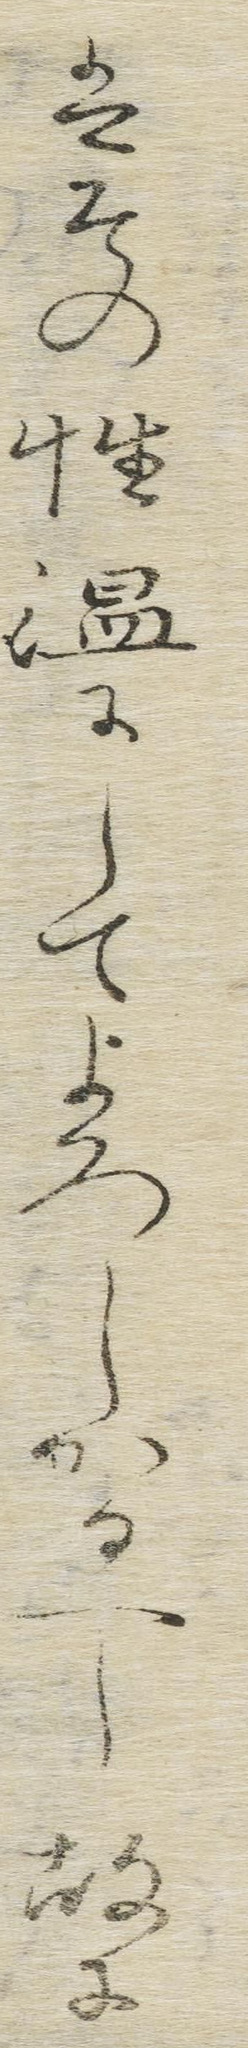はその性温にしてよろしかるへし故に
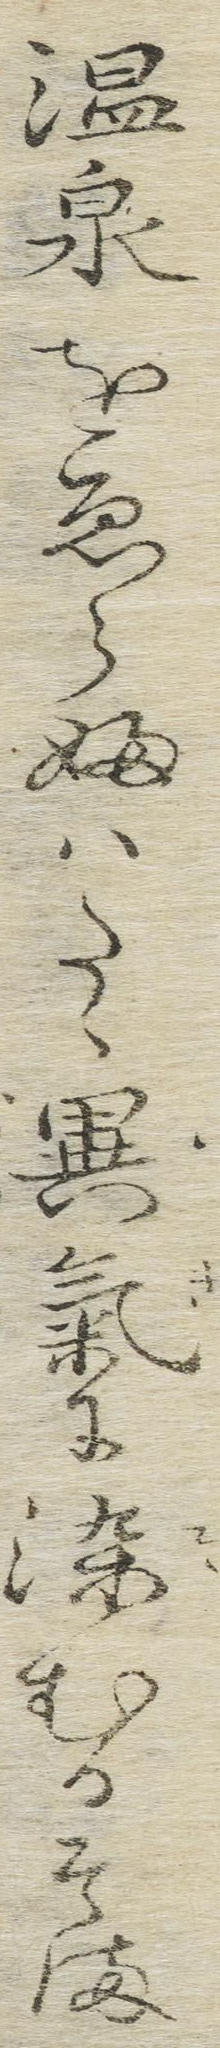温泉をゑらふはたゝ異気に染むるそま
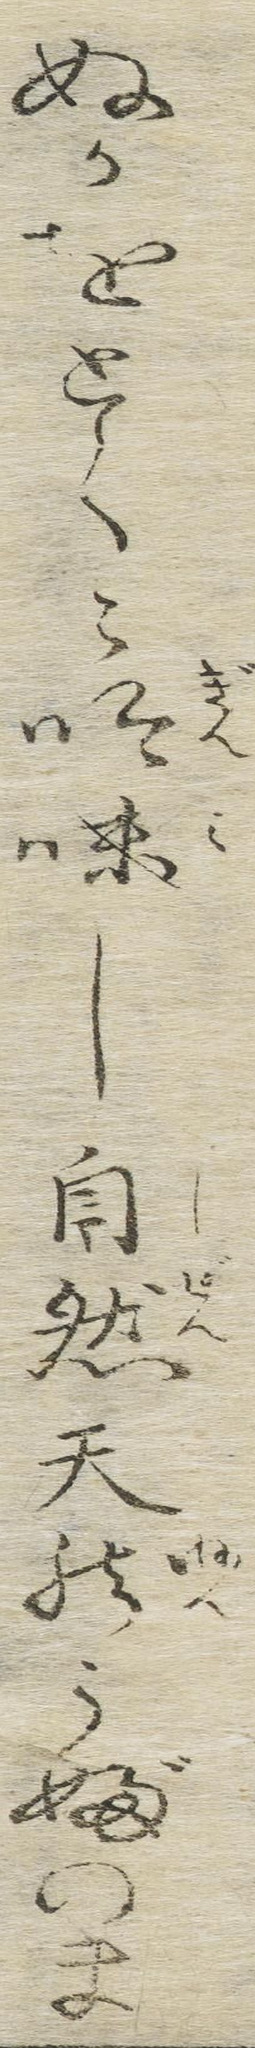ぬかをとくと吟味し自然天然うぶのま
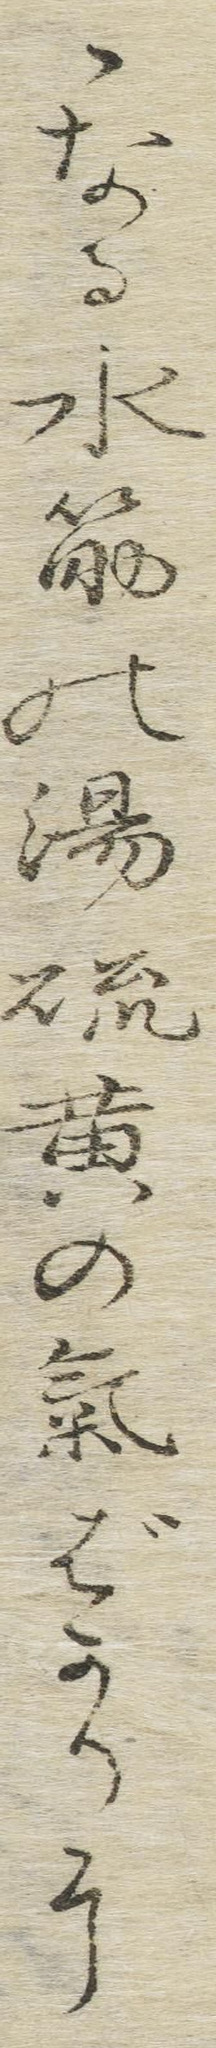ゝなる水筋の湯硫黄の気ばかりに

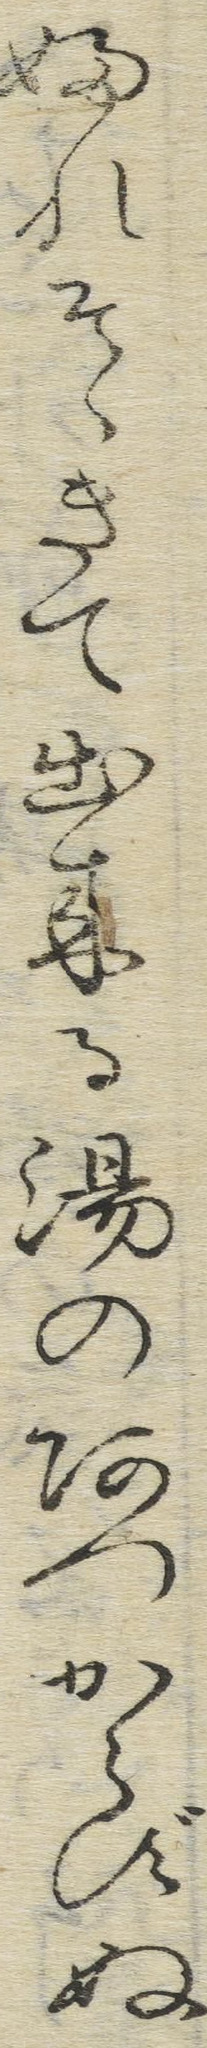ふれそゝきて出来る湯のあつからずぬ
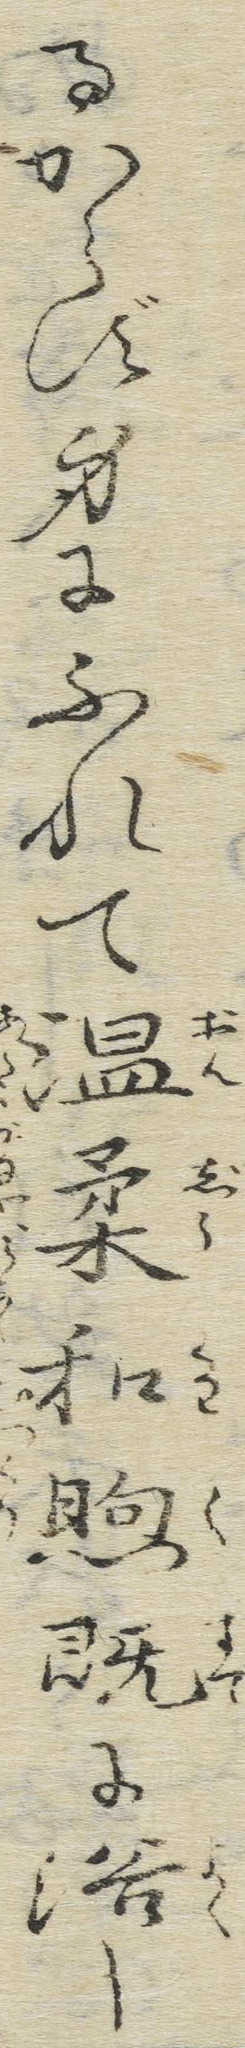るからず身にふれて温柔和煦既に浴し
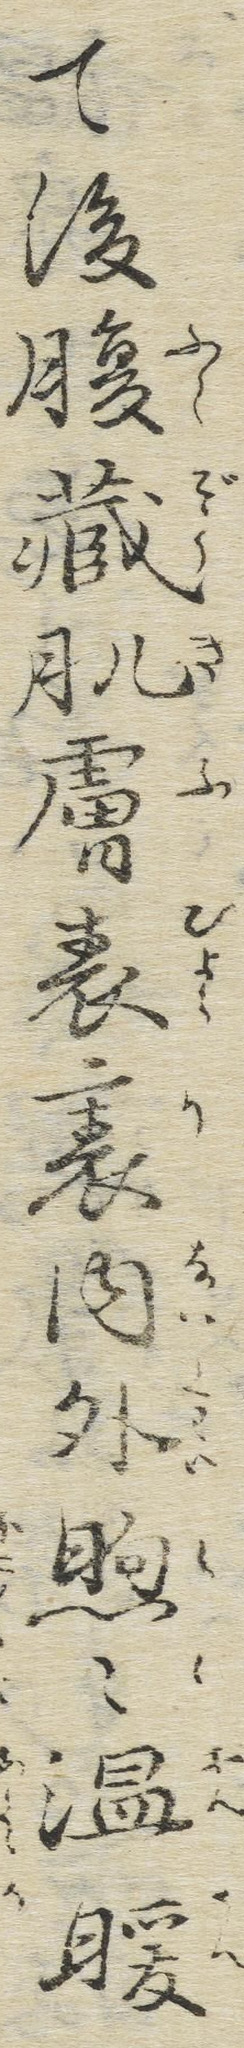て後腹蔵肌膚表裏内外煦ゝ温暖
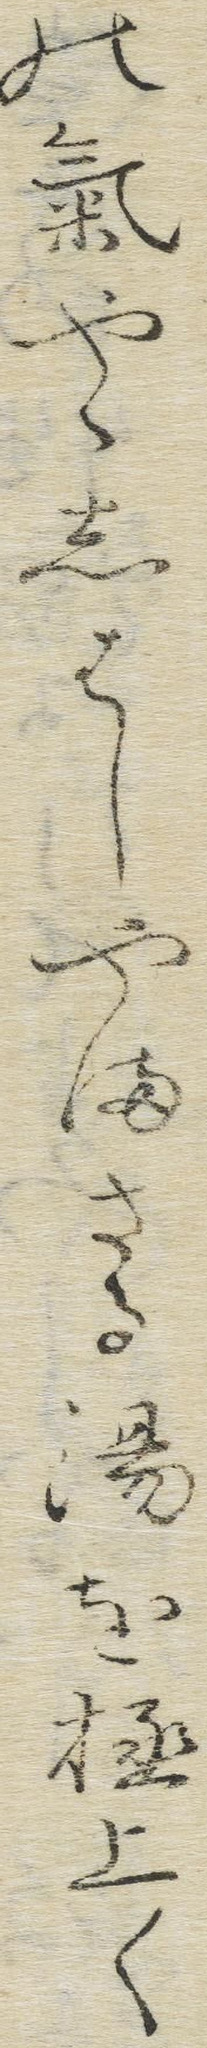の気やゝしはしやまさる湯を極上〳〵
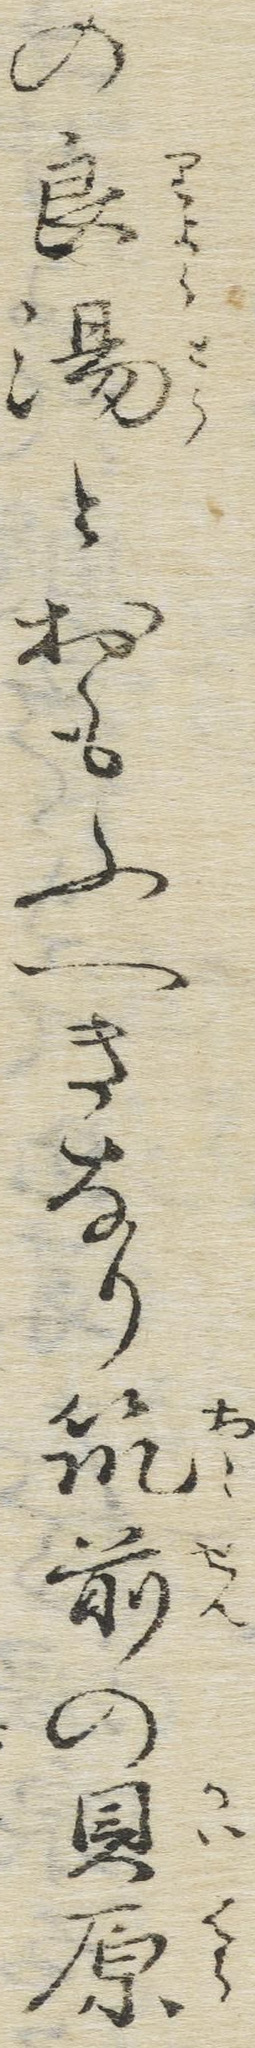の良湯とおもふへきなり筑前の貝原
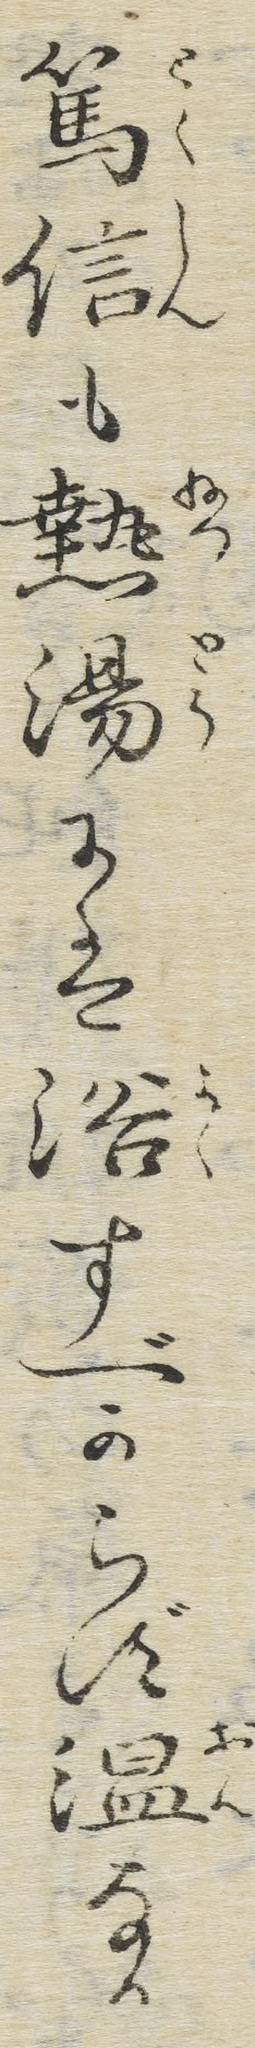篤信も熱湯には浴すべからず温なる
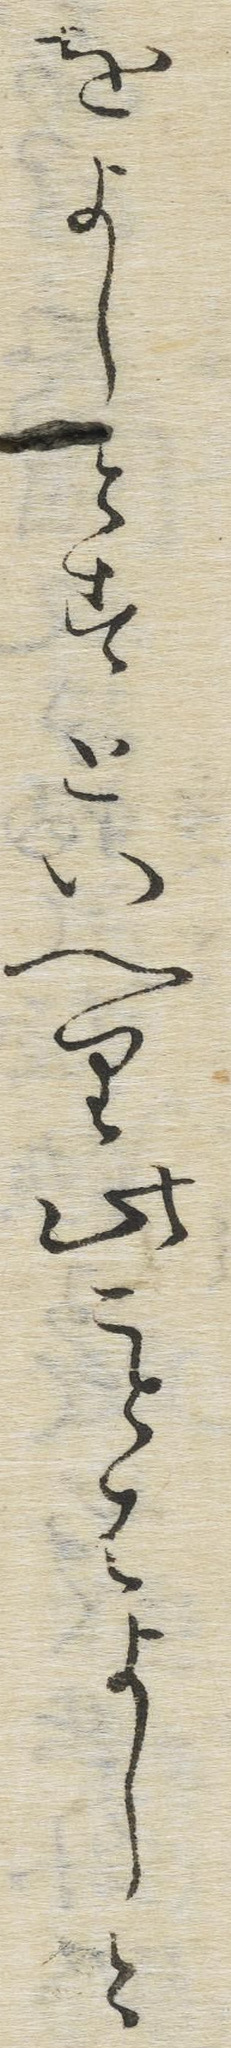をよしとすといへり此ことはよしと
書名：温泉考
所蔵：東京大学地震研究所図書室 Earthquake Research Institute Library, The University of Tokyo, JAPAN
